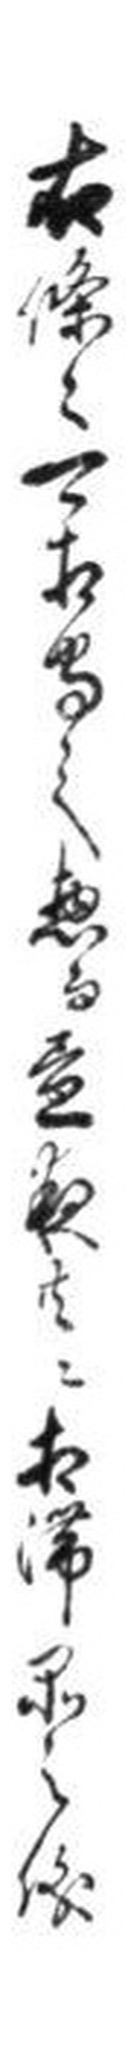右条々可相守之惣而昼夜共ニ相滞品之儀
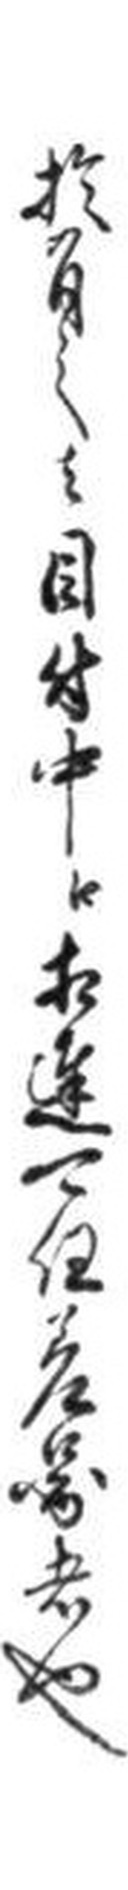於有之者目付中江相達可任差図者也
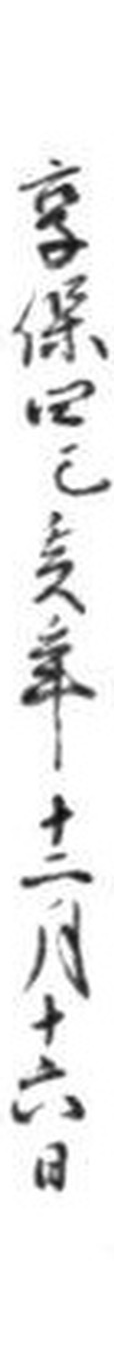享保四己亥年十二月十六日
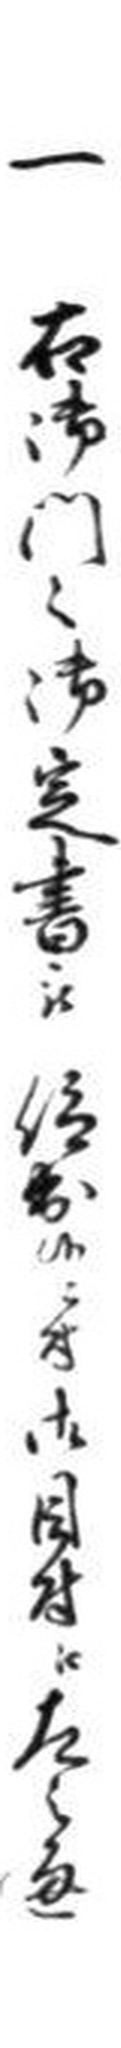一右御門々御定書被仰出候ニ付御目付江左之通
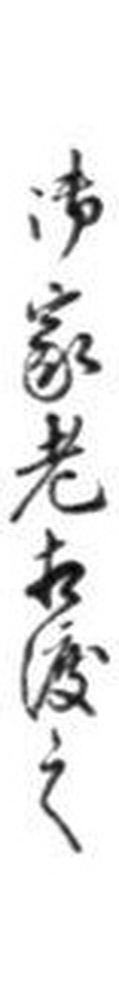御家老相渡之
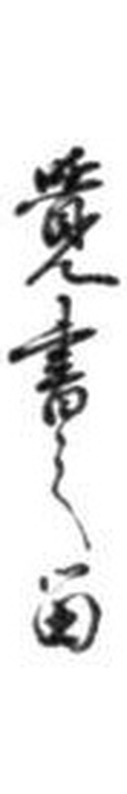覚書之留
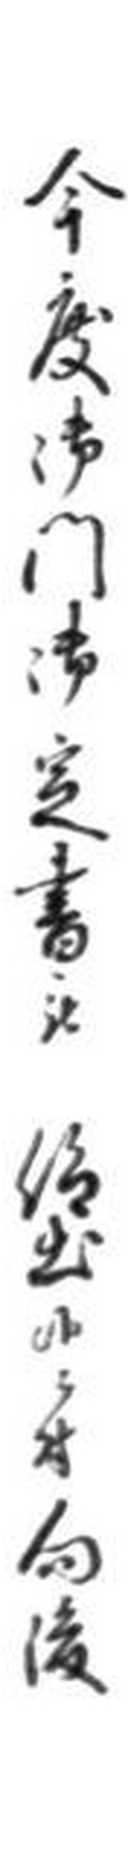今度御門御定書被仰出候ニ付向後
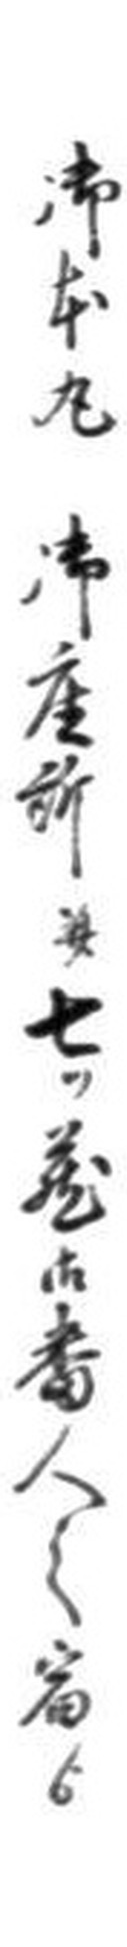御本丸御座所并七ツ蔵御番人之宿ゟ
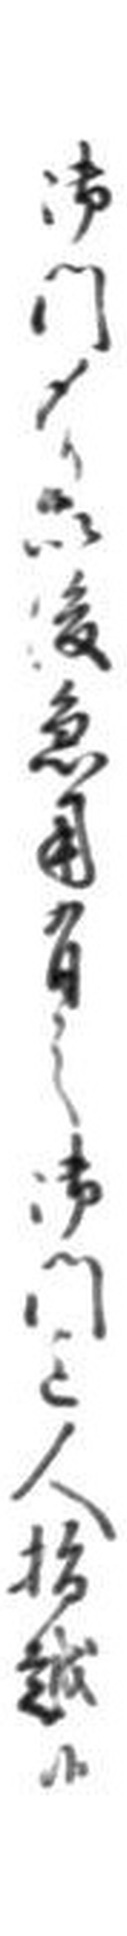御門〆り以後急用有之御門迄人指越候
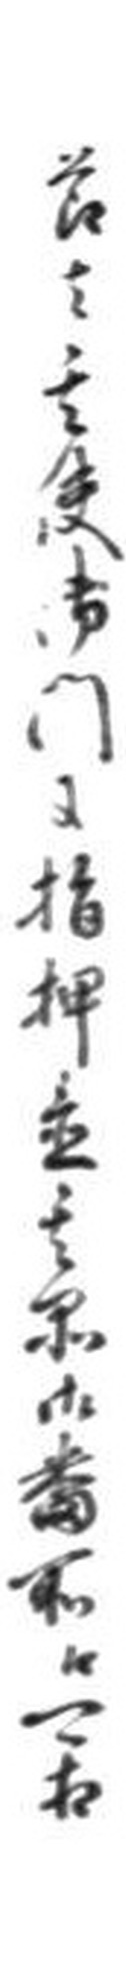節者其使御門に指押置其品御番所江可相
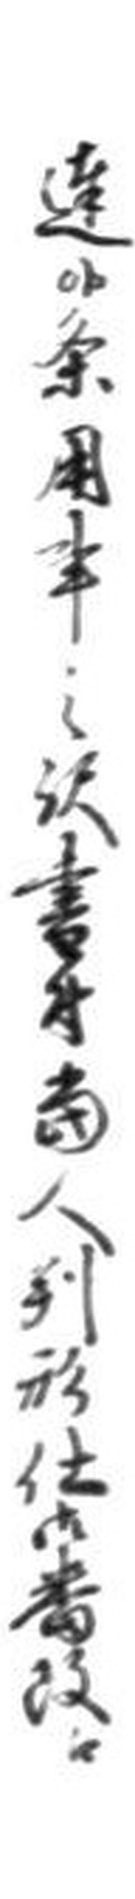達候条用事之訳書付当人判形仕御番改江
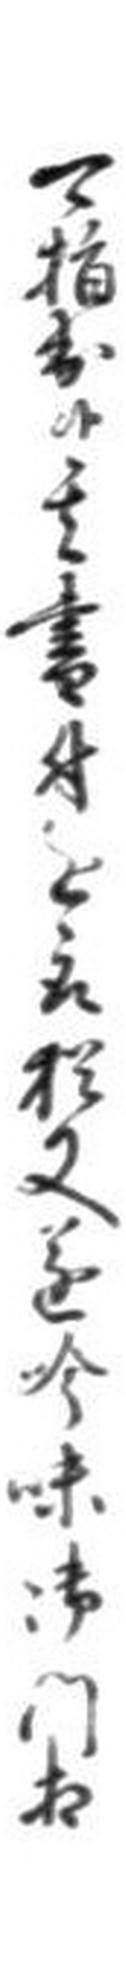可指出候其書付を取猶又遂吟味御門相
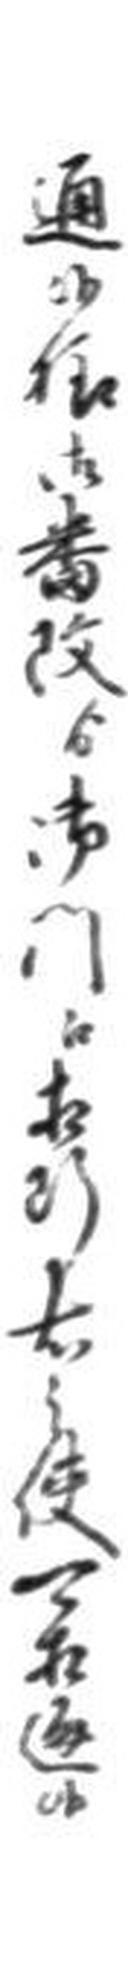通候様御番改ゟ御門江相断右之使可相通候
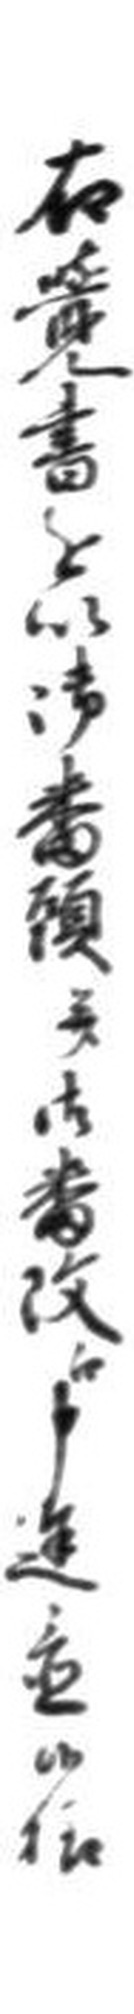右覚書を以御番頭并御番改江申達置候様

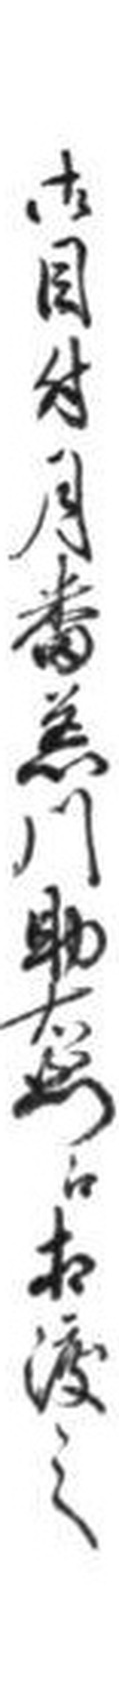御目付月番荒川助右衛門江相渡之
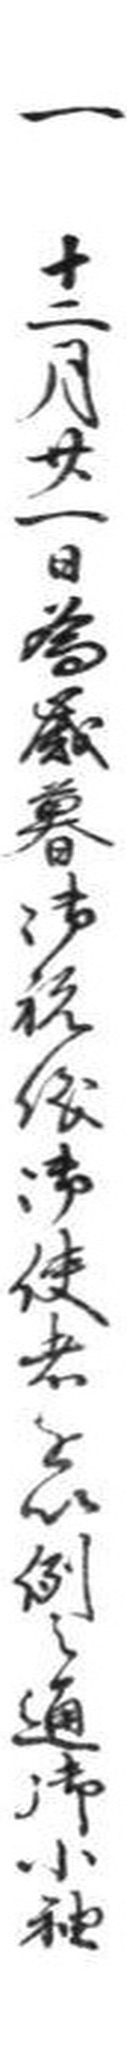一十二月廿一日為歳暮御祝儀御使者を以例之通御小袖
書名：家譜 三十三 吉邦公 享保四年
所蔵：福井県文書館 Fukui Prefectural Archives
